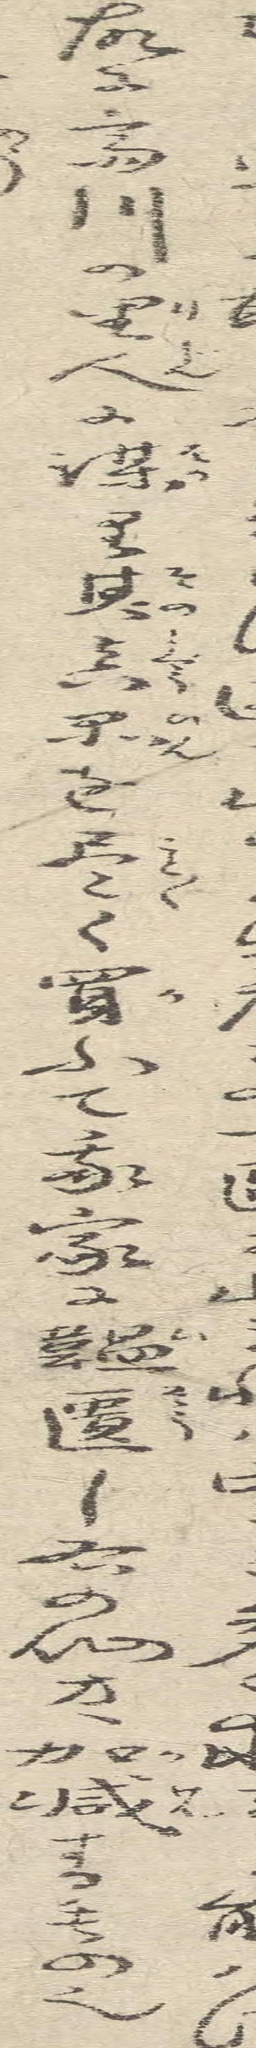故に斎川の里人に謀り其真品を尽々く買ふて我家に韞匱し各の仙方加減するもの也
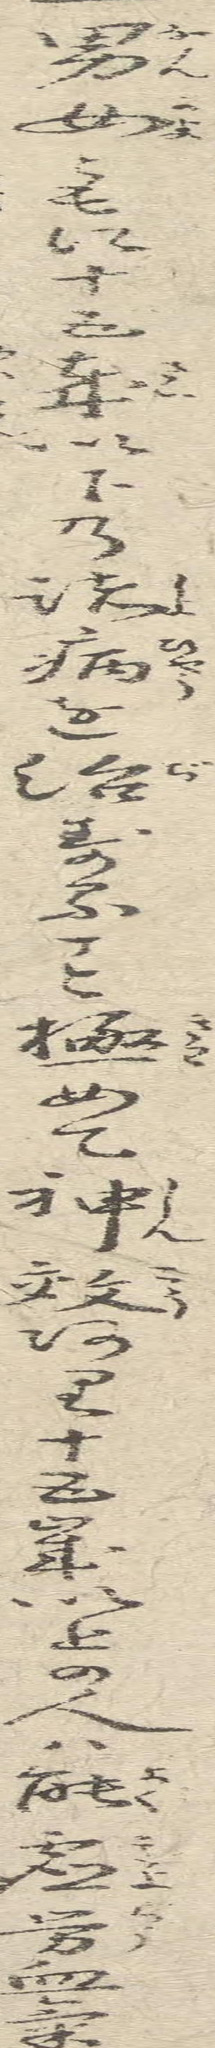一男女ともに十五歳以下の諸病を治すること極めて神効あり十五歳以上の人は能虚労血気
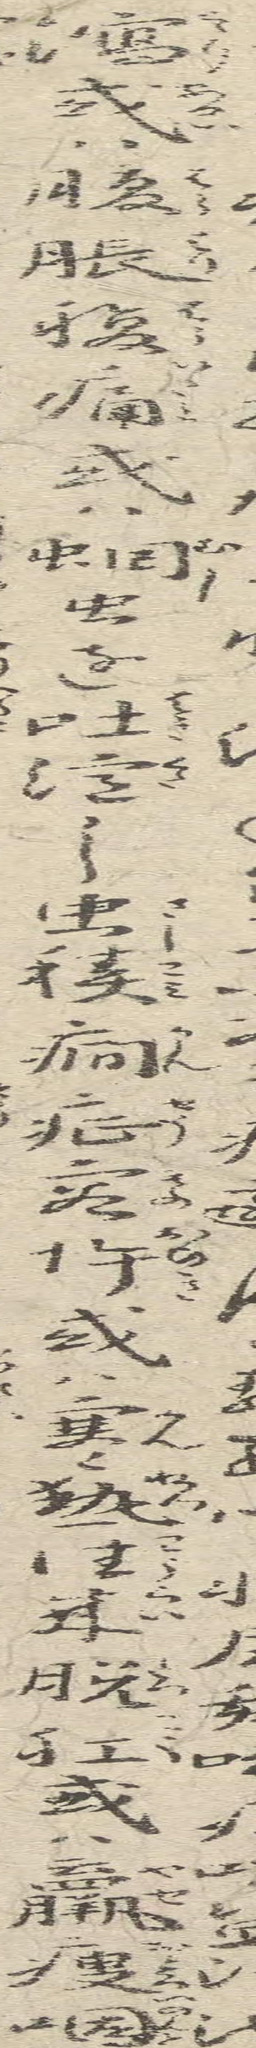瀉或は腹脹腹痛或は蛔虫を吐瀉し虫積癇症客忤或は寒熱往来脱肛或は羸痩咽
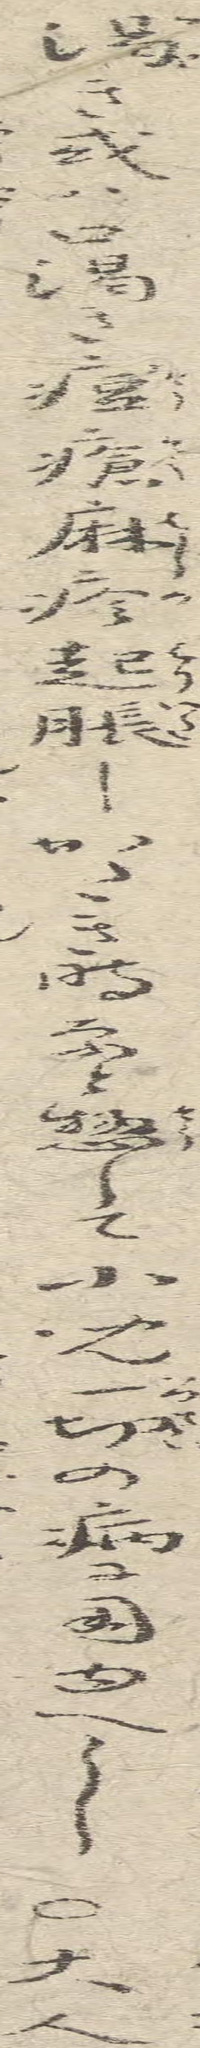渇き或は口渇き痘瘡麻疹起脹しかたき時なと惣して小児一切の病に用ゆへし○大人は
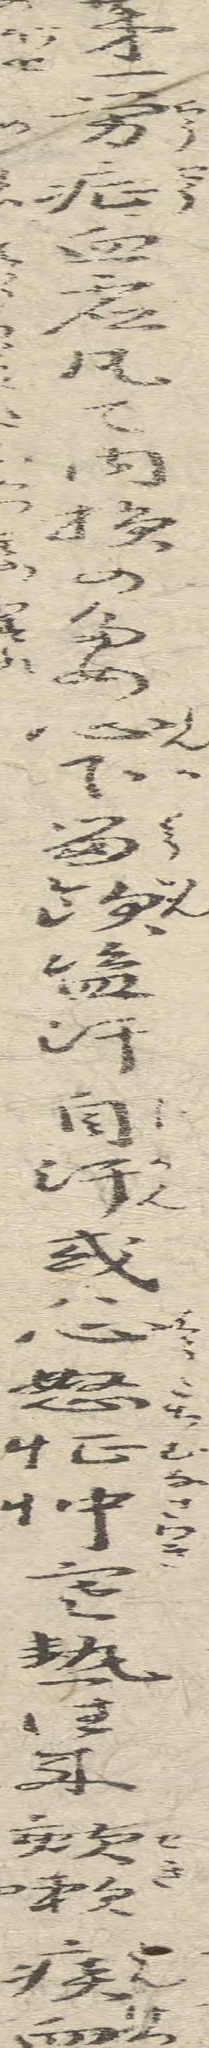第一労症血虚凡て内損のため心下留飲盗汗自汗或は心怒怔忡寒熱往来欬嗽痰血
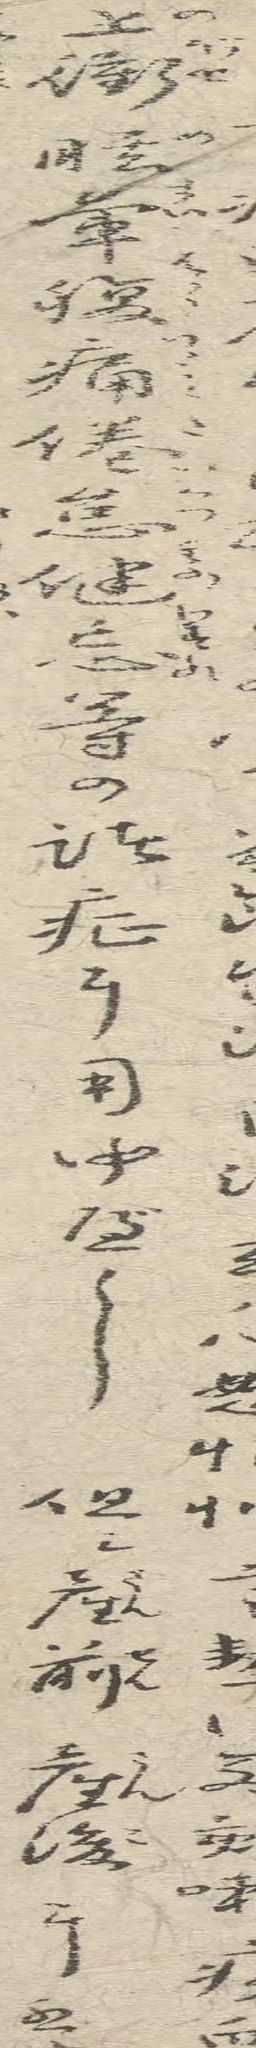上衝眩暈腹痛倦怠健忘等の諸症に用ゆべし但し産前産後には
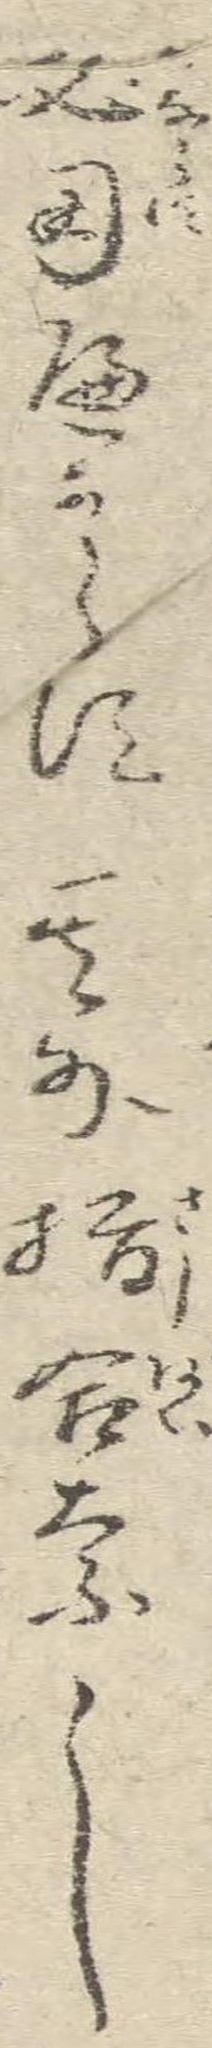必用へからす其外指合なし
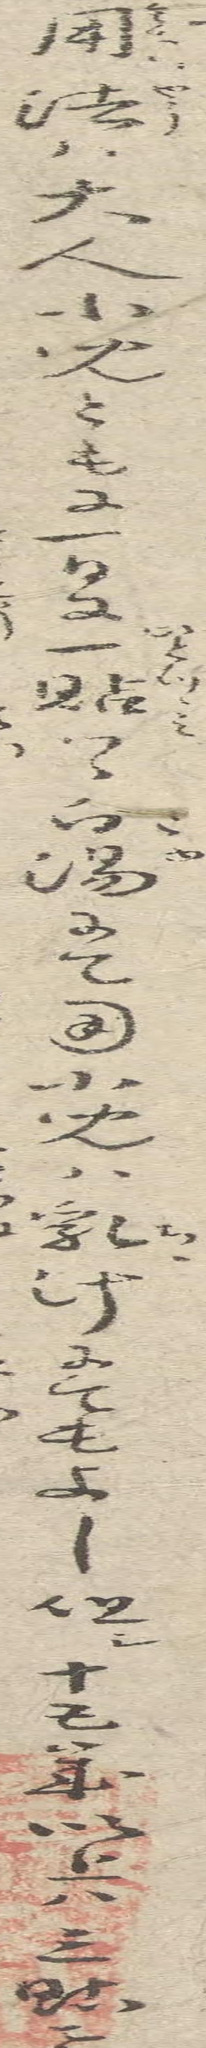一用法は大人小児ともに一日に一貼つゝ白湯にて用小児は乳汁にてもよし但し十五歳以上は三貼を
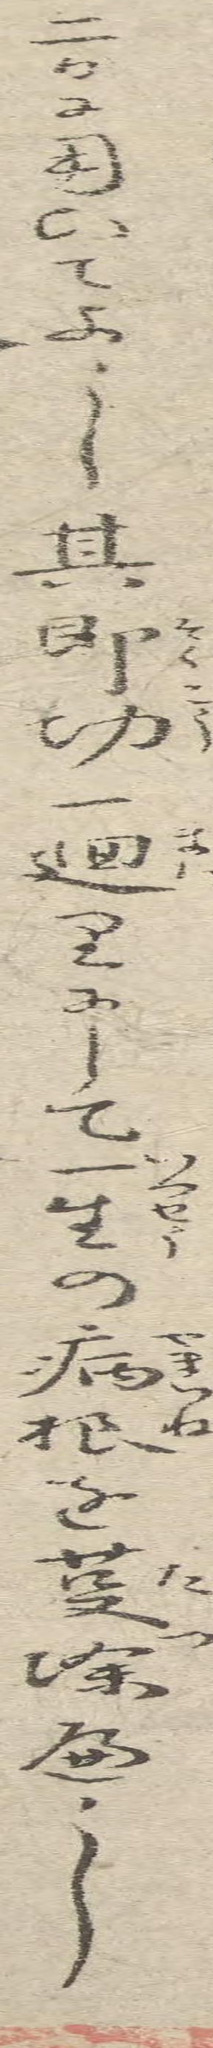二日に用ひてよし其即功一廻りにして一生の病根を芟除へし
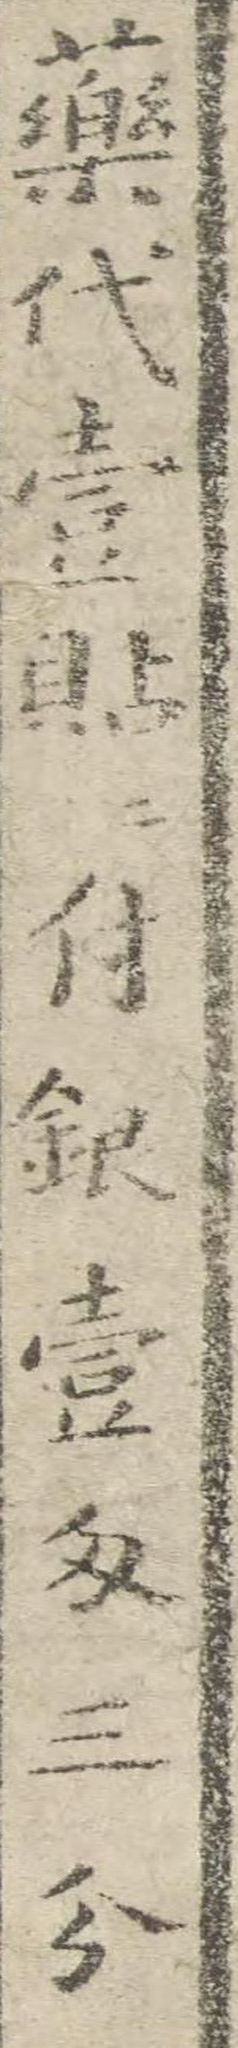薬代壱貼に付銀壱匁三分

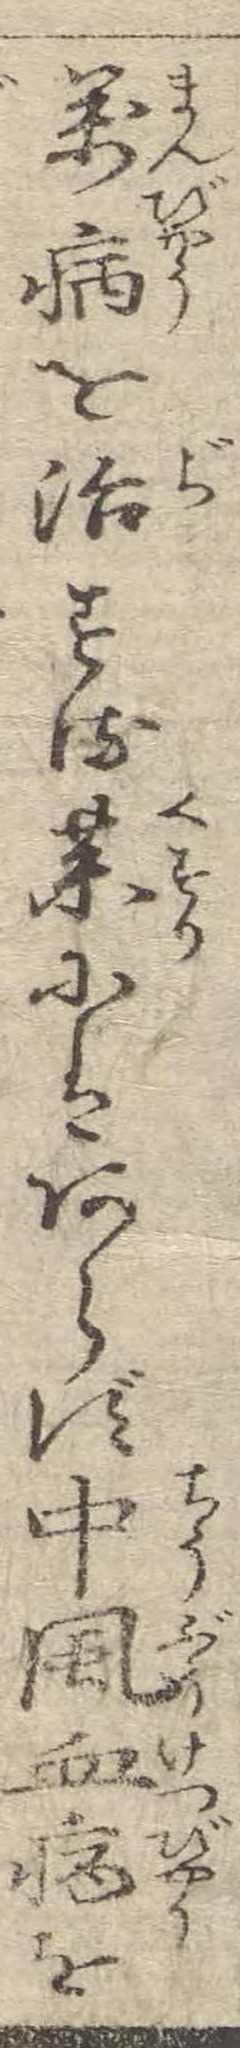万病を治する薬にはあらず中風血病を
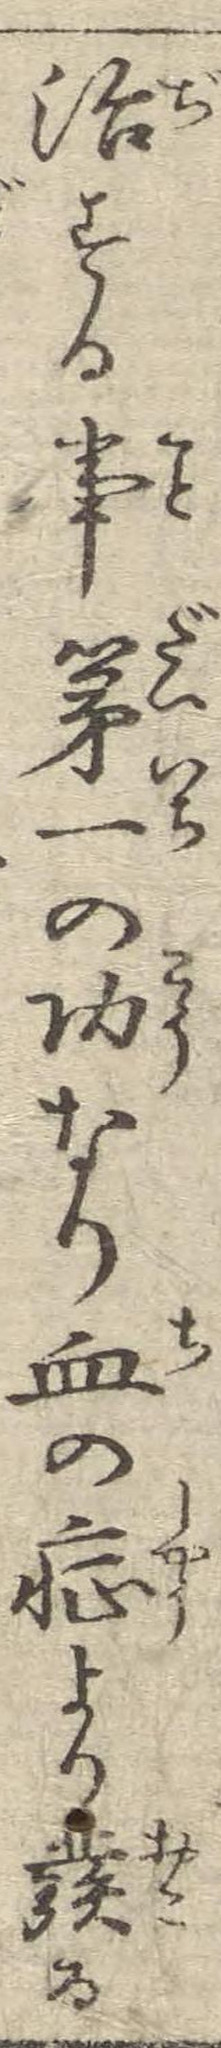治する事第一の功なり血の症より発る
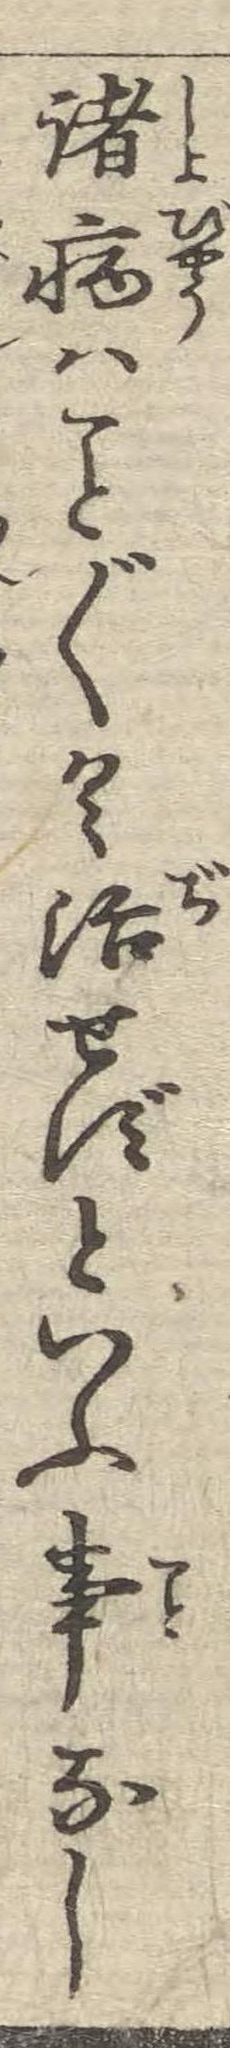諸病はこと〴〵く治せずといふ事なし
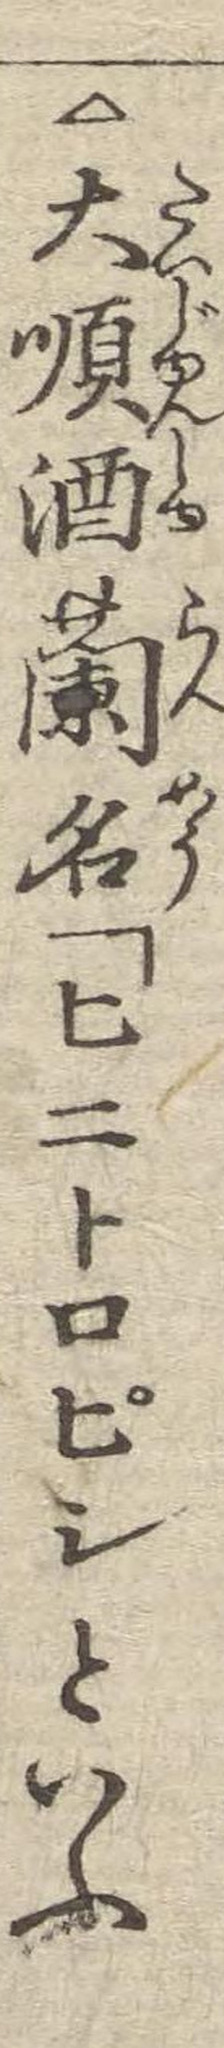△大順酒蘭名「ヒニトロピシといふ
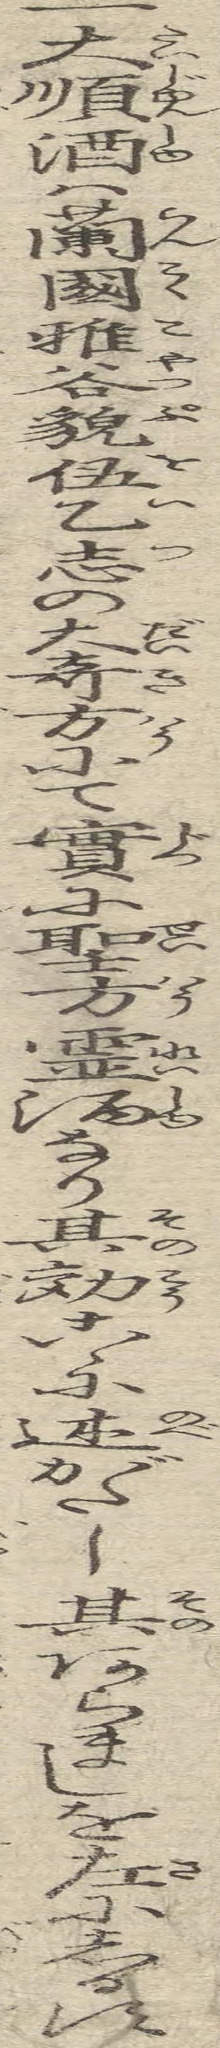一大順酒は蘭国雅谷貌伍乙志の大奇方にて実に聖方霊酒なり其効こゝに述がたし其あらましを左にしるす
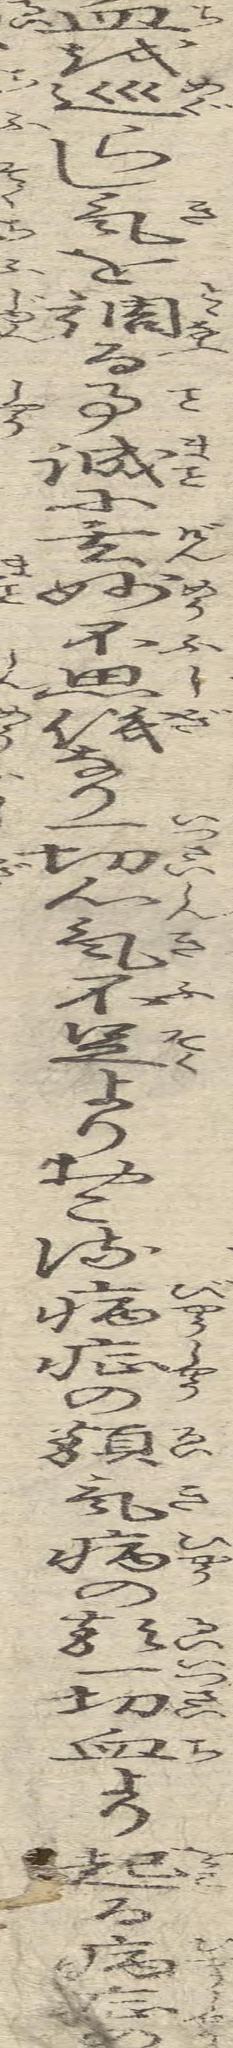血を巡らし気を調る事誠に玄妙不思議なり一切心気不足よりおこる病症の類気病の類一切血より起る病症の
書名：浪華薬種問屋能書張交帖. 一
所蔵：国立国会図書館 National Diet Library, JAPAN
